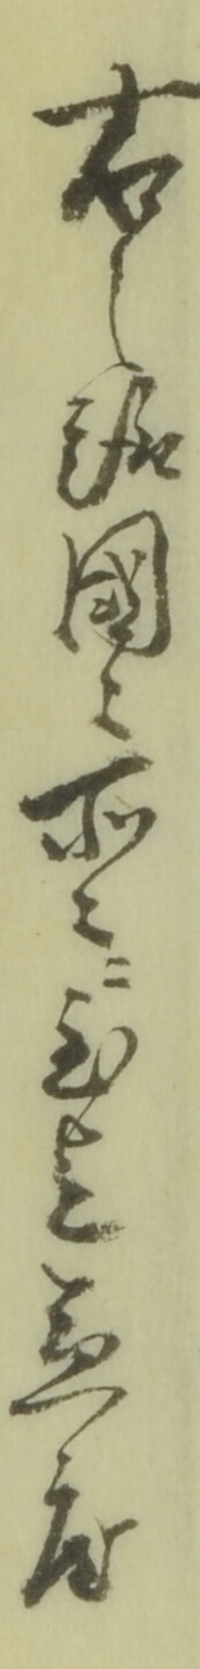右之趣国々所々ニ至迄急度

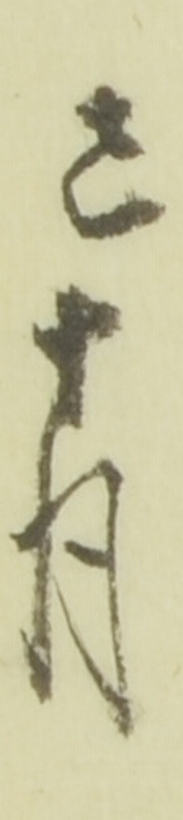巳十月
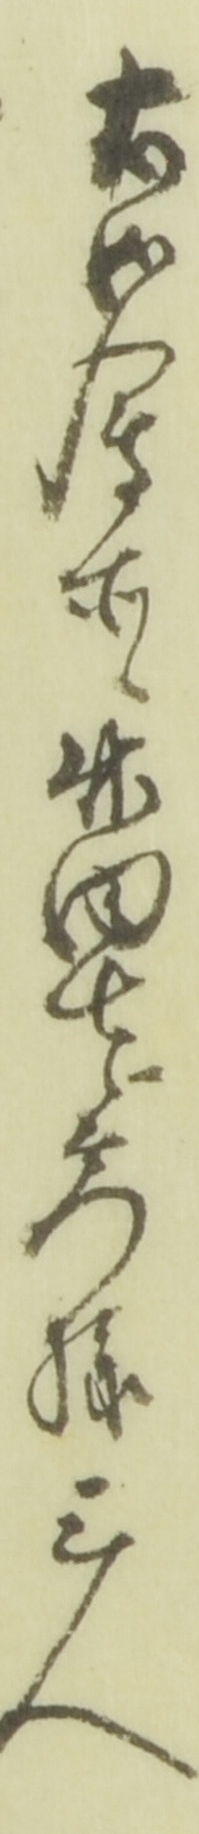右御会所へ竹田七郎右衛門様三人
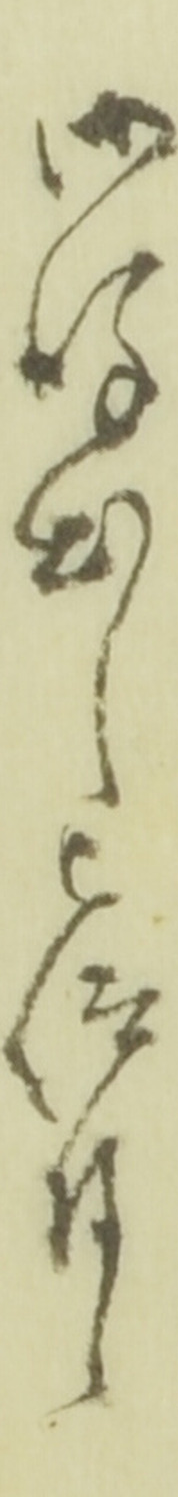御呼出し被仰付候
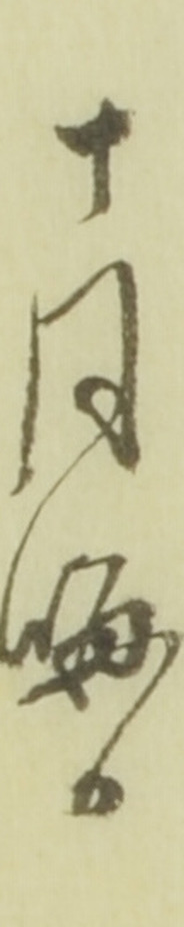十月晦日
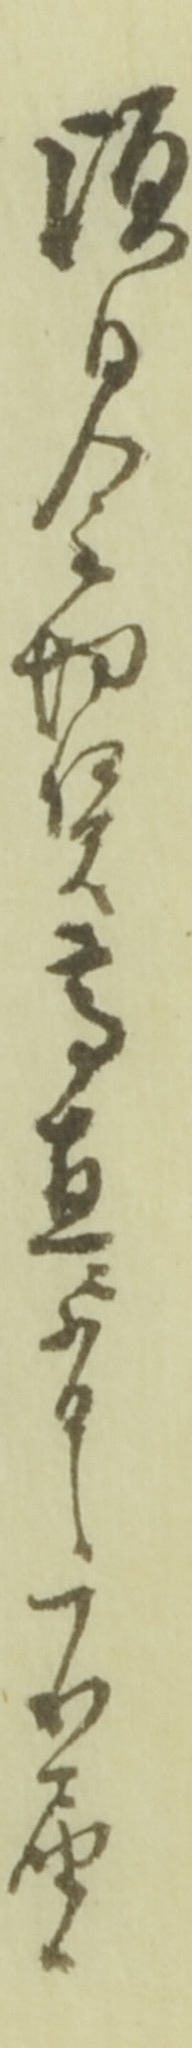頃日金切賃高値ニ有之不届候
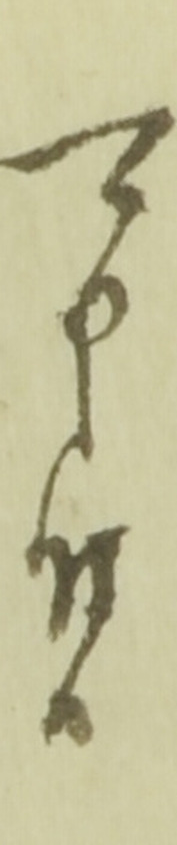可申付候
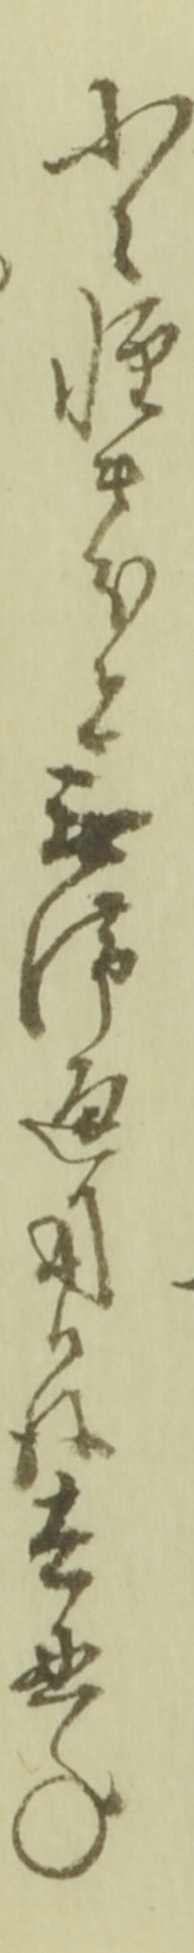少々軽キ分者無滞通用候様去丑年
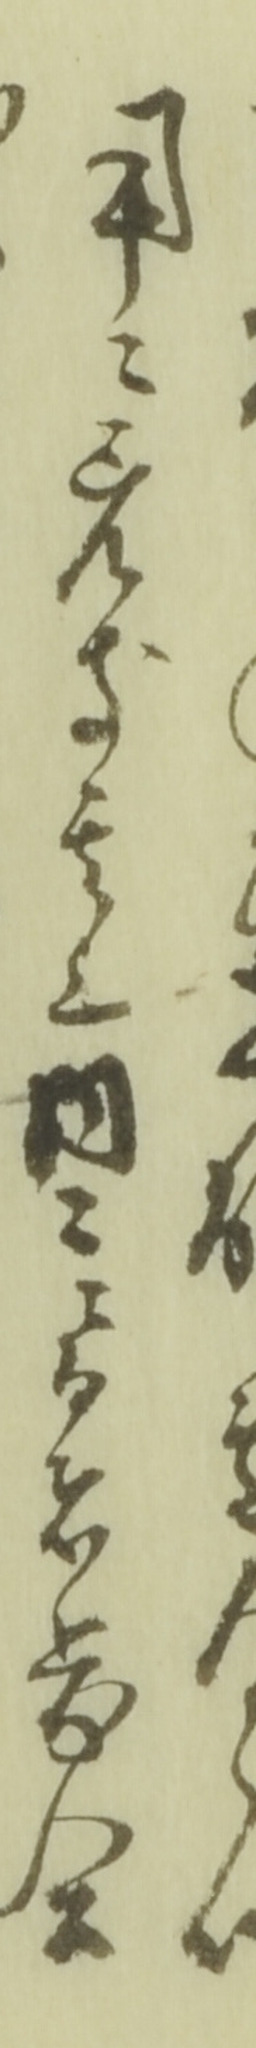用ニ差支其上内々に而者歩合
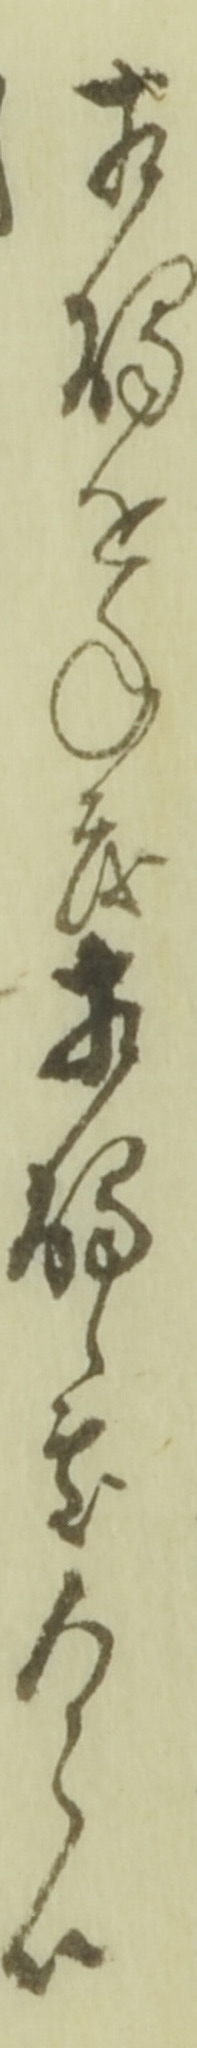相触近年茂相触候處今以
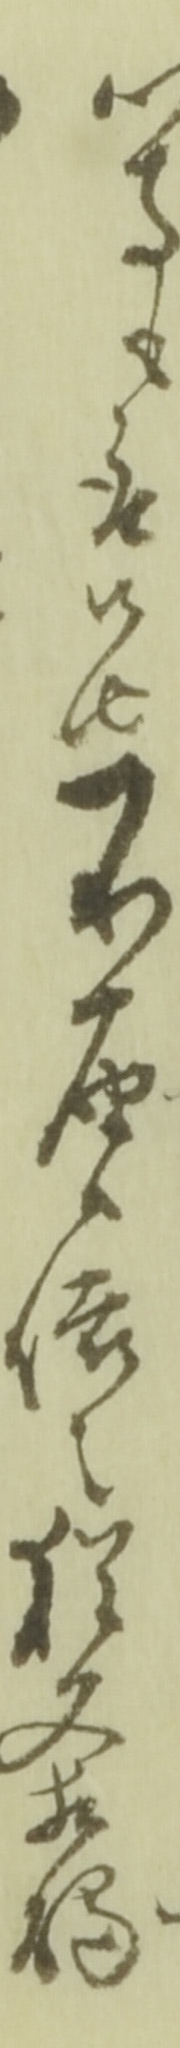等も取候由不届候依之猶又相触
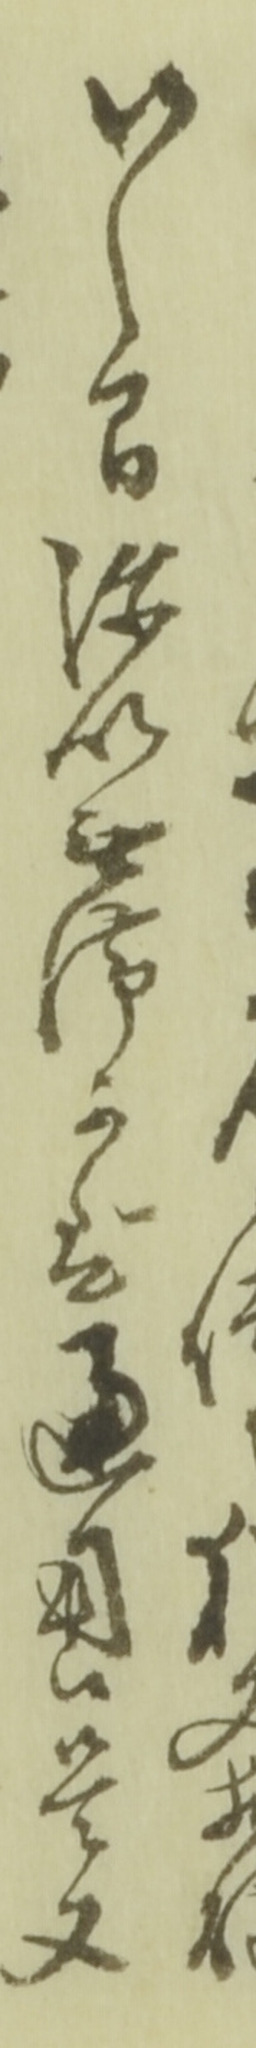候之間弥以無滞可致通用候是又
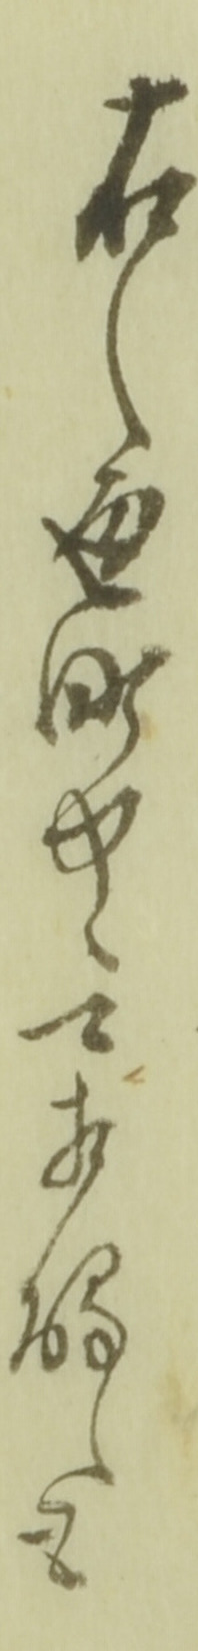右之通町中へ可相触候以上
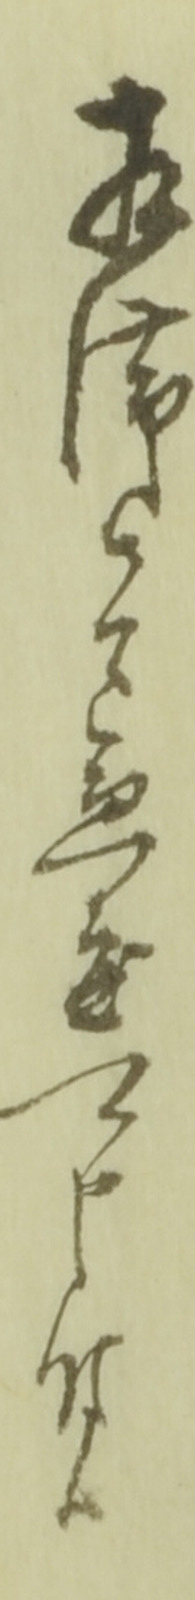相滞候はゝ急度可申付候
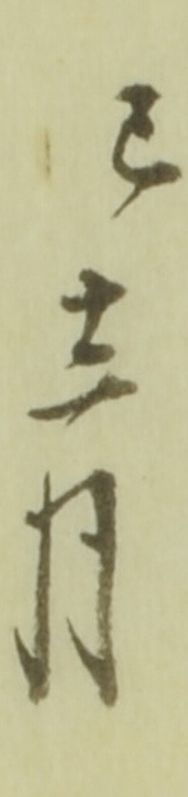巳十二月
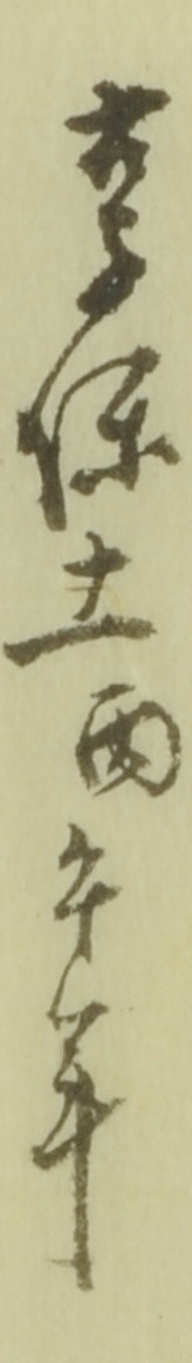享保十一丙午年
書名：御公儀様御領主様御触書控
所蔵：伊那市立高遠町図書館・合同会社AMANE
